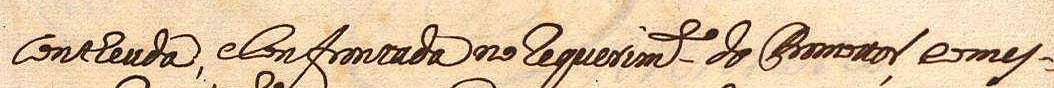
contheuda, e Confrontada no Requerim.to do Promotor, e o mes
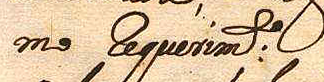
mo Requerimt.o
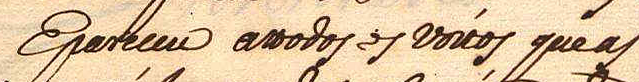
E pareçeu a ttodos os vottos, que as
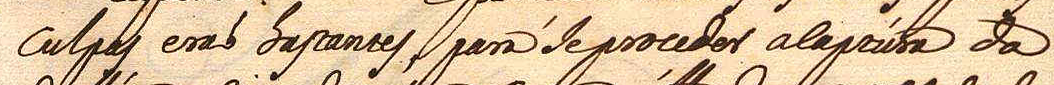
culpas eraõ bastantes, para se proçeder a captura da
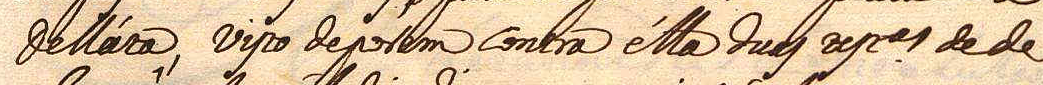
delláta, visto deporem contra ella duas test.as de de
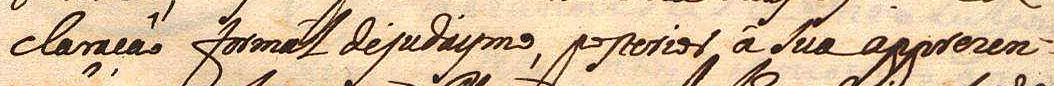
claração formaL de judaismo, posterior á Sua apprezen
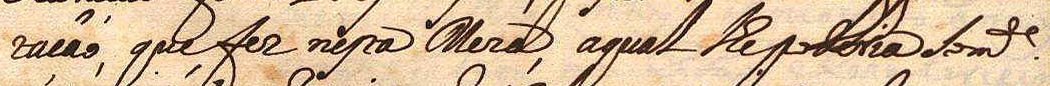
tação, que fez nesta Meza, a qual lhe poderia Somte.
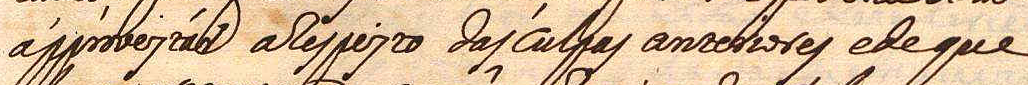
approvejtar a Respejto das culpas anteriores e de que
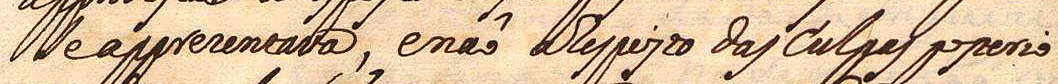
Se apprezentava, e naõ a Respejto das culpas posterio
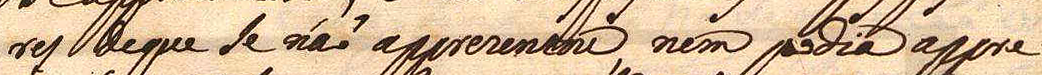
res de que se naõ apprezentou, nem podia appre
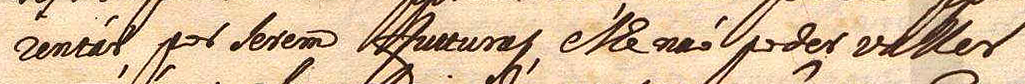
zentár, por serem futturas, e lhe naõ poder valler
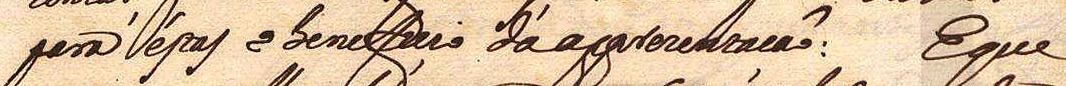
para éstas o beneffiçio da apprezentaçaõ: E que
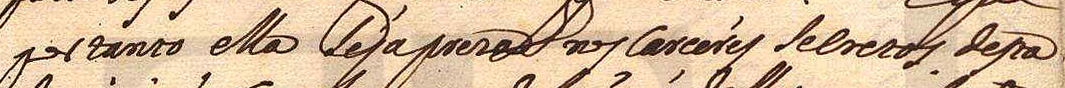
portanto ella seja preza nos carçeres secretos desta
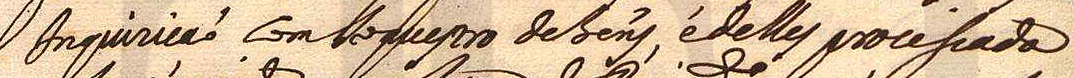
Jnquiziçaõ Com soquestro de ben̄s, e delles processada
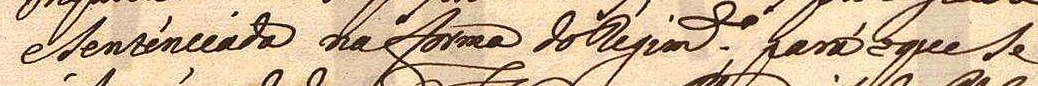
e Sentençiada na forma do Regim.to para o que Se
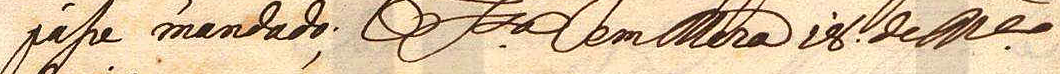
páse mándado. L.xa em Meza i8. de M.co
